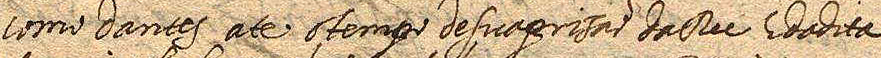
como dantes ate o tempo de sua prizaõ da Ree E da dita
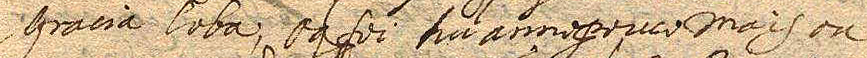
Gracia loba, o q̄ foi hū anno pouco mais ou
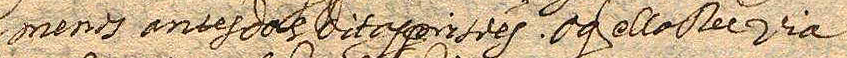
menos antes das ditas prisoẽs. O q̄ ella Ree via
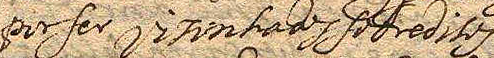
por ser vizinha dos sobreditos
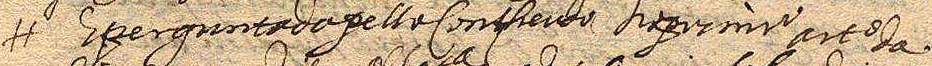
item E perguntada pello Contheudo no primro arto da
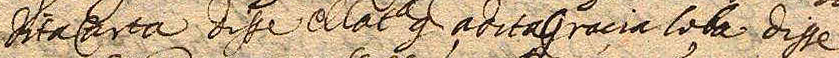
dita Carta disse ella ta q̄ a dita Graçia loba disse
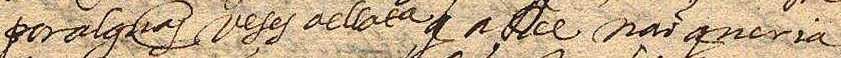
por alguas̄ veses a ella ta q̄ a Ree naõ queria
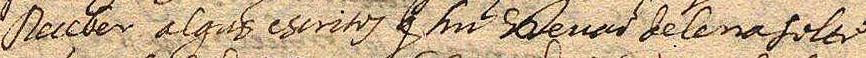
Reçeber algus̄ escritos q̄ hū Esteuaõ de lena soltro
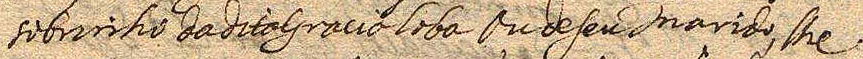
sobrinho da dita Gracia Loba ou de seu Marido, lhe
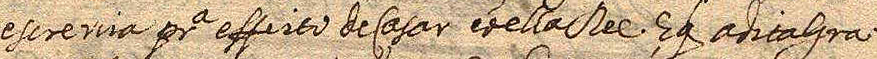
escreuia pra effeito de Casar cō ella Ree. E q̄ a dita Gra
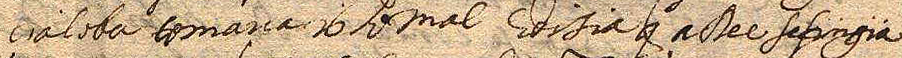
çia loba tomaua isto mal E dizia q̄ a Ree se fingia
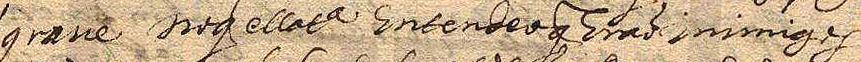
graue no q̄ ella ta Entendeo q̄ Eraõ inimigos.
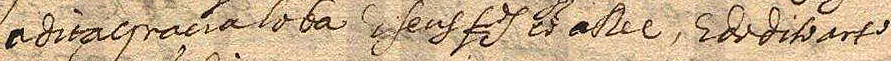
a dita Graçia loba E seus fos cō a Ree, E do dito arto
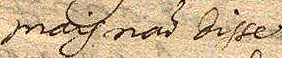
mais naõ disse
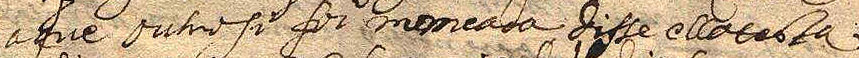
a que outrosi foi nomeada disse ella testa
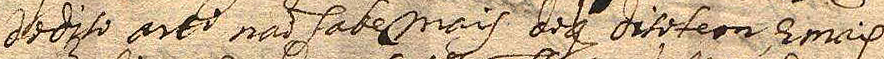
do dito arto naõ sabe mais do q̄ dito tem, E mais
